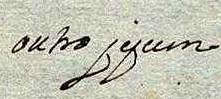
outro jejum
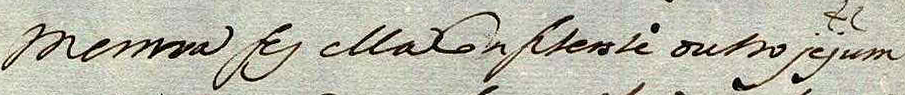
mesma fes ella Confitente outro jejum
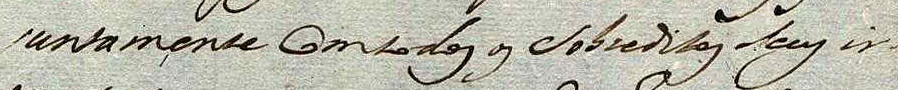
juntamente com todos os sobreditos seus ir
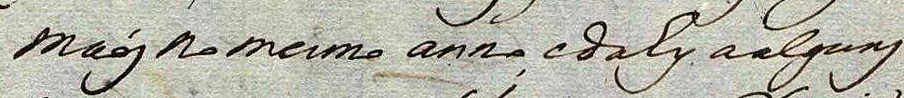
maõs no mesmo anno, e dahy a alguns
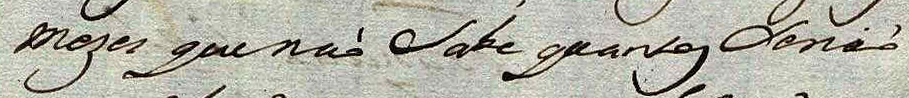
mezes que naõ sabe quantos seriaõ
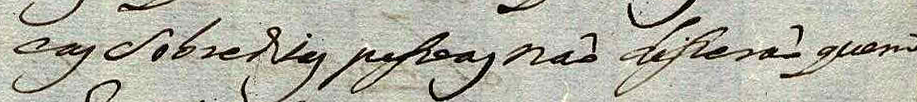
e as sobreditas pessoas naõ disseraõ quem
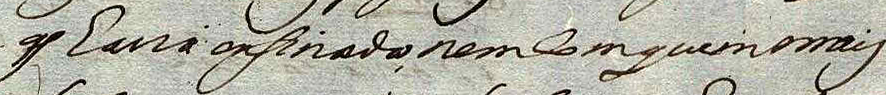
qas havia ensinado, nem com quem o mais
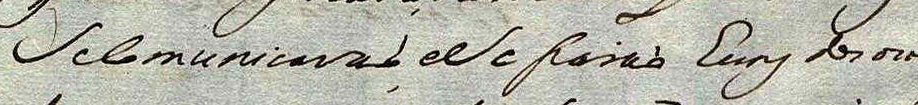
Se comunicavaõ e se fiaraõ huns dos ou
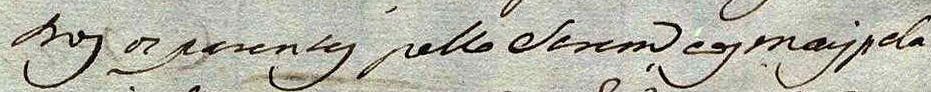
tros os parentes pello serem, e os mais pela
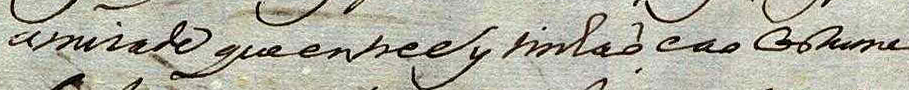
amizade que entre Sy tinhaõ, e ao costume
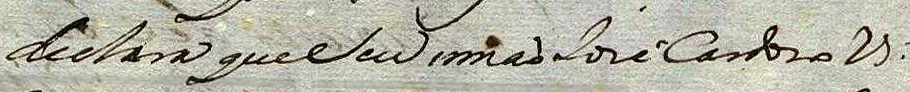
declara que seu irmaõ Iozé Cardoso Vi
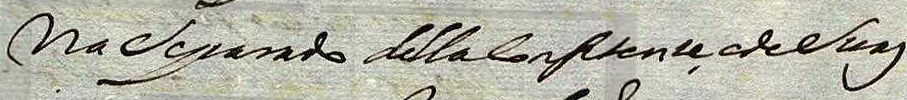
via separado della confitente e de Suas
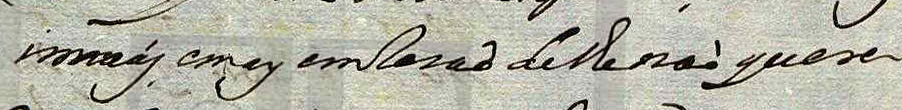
imaãs, e may em Razaõ de lhe naõ quere
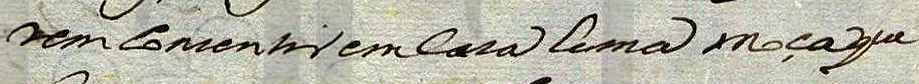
rem consentir em caza huma moça que
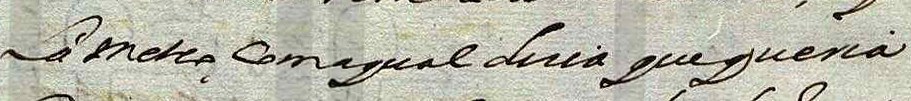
Lá meteo, com a qual dizia que queria
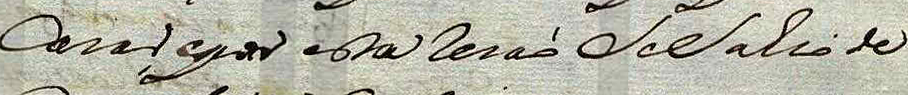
cazar, e por esta Rezaõ se Sahio de
